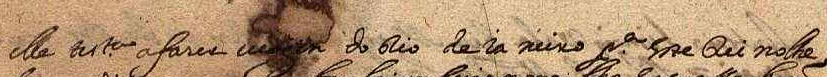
elle test.a a fazer uiagen do Rio de Ianeiro p.a Este Reino lhe
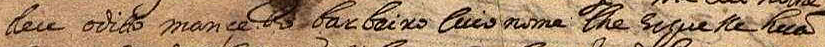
deu o dito mancebo barbeiro Cuio nome lhe Esquesse huā
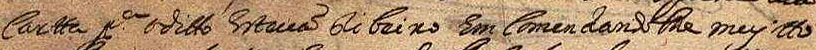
Cartta pa o ditto Esteuaõ Ribeiro EmComendando lhe mujtto
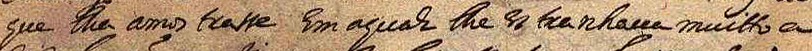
que lha amostrasse Em a qual lhe Estranhaua muitto a
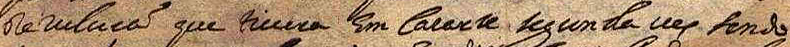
Rezuluçaõ que tiuera Em Cazarse segunda ues sendo
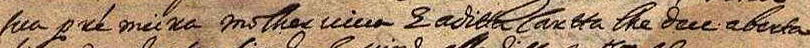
sua premeira molher uiua E a ditta Cartta lhe deu aberta
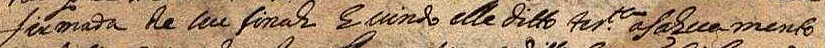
firmada de seu sinal E uindo elle ditto tes.ta a saluamento
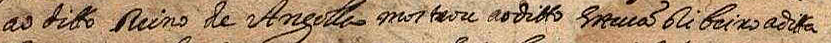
ao ditto Reino de Angolla mostrou ao ditto Esteuaõ Ribeiro a ditta
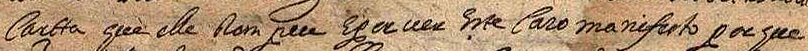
Cartta que elle Rompeu E por uer Este Cazo manifesto por que
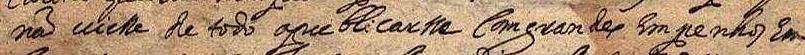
não uiesse de todo a publicarsse Com grandes Empenhos Em
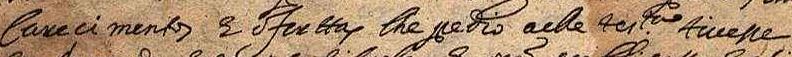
Carecimentos E oferttas lhe pedio a elle test.a tiuesse
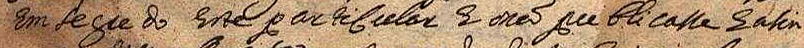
Em segredo Este partiCular E o naõ publicasse E asin
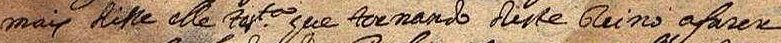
mais disse elle test.a que tornando deste Reino a fazer
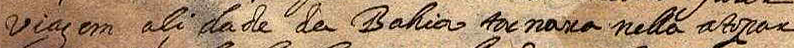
viagem a Cidade da Bahia tornara nella a topar
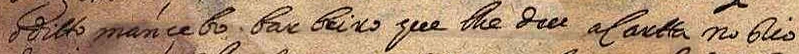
o ditto mancebo barbeiro que lhe deu a Cartta no Rio
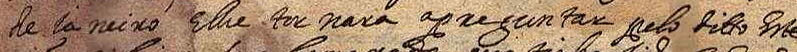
de Ianeiro E lhe tornara a preguntar pelo ditto Este
